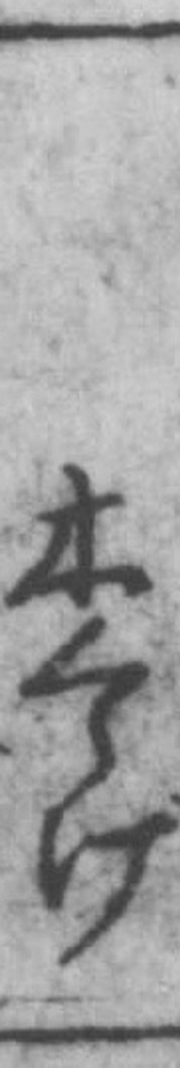木くらげ
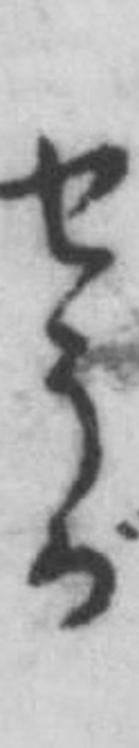せうが
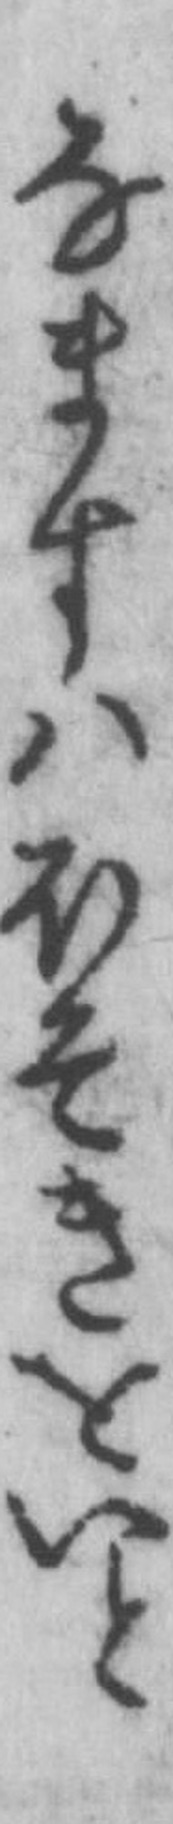なますハほそきをいと
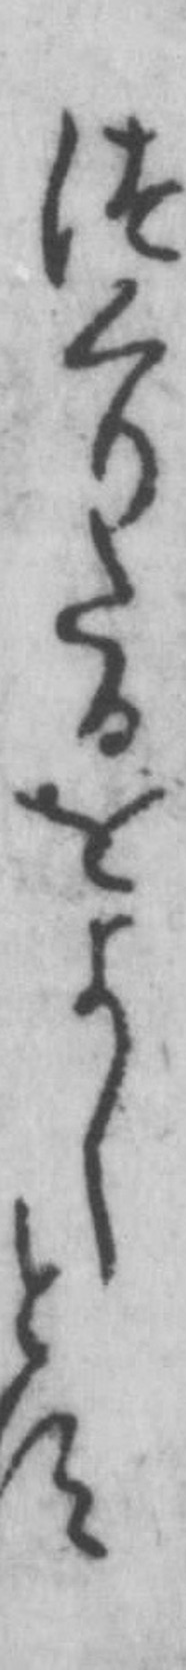つくりたるをよしとす
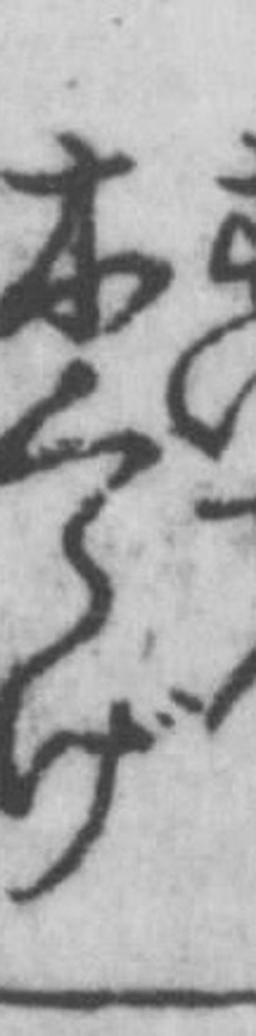木くらげ
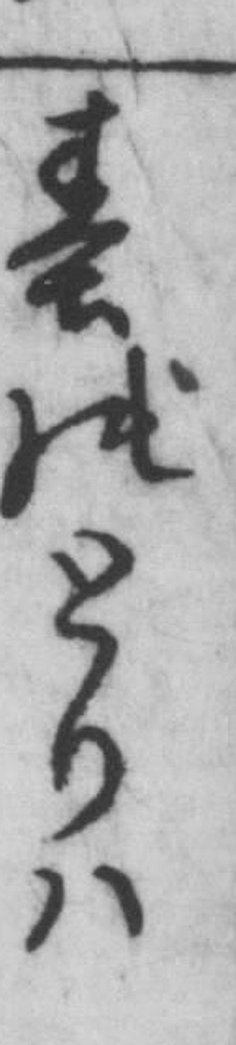春のとりハ
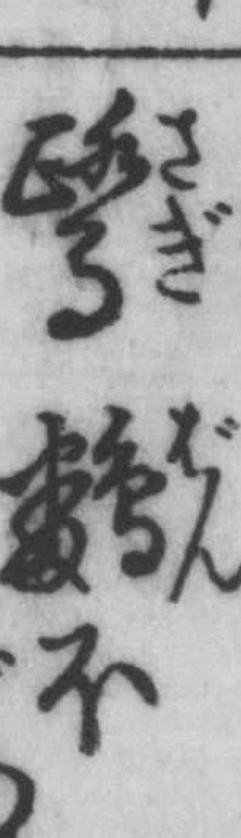鷺鷭ほ
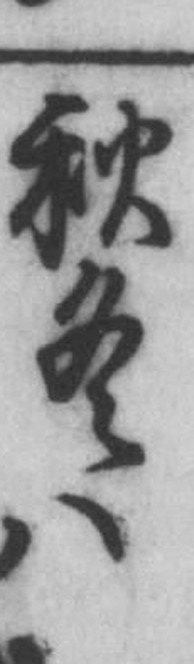秋冬ハ
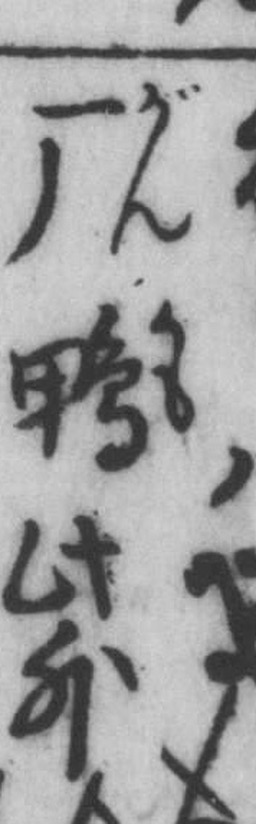鴈鴨此外
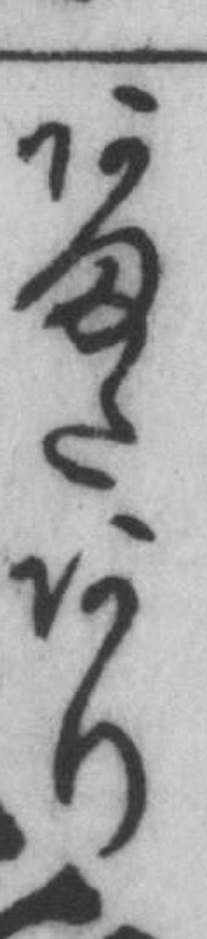あまたあり
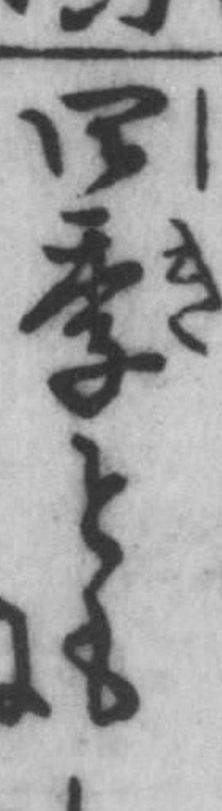四季とも
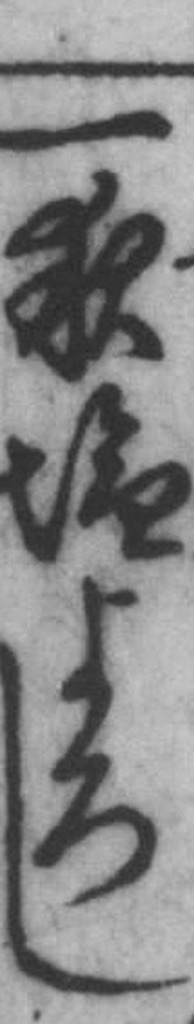市塩よろし

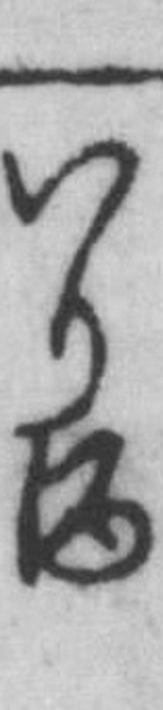はり酒
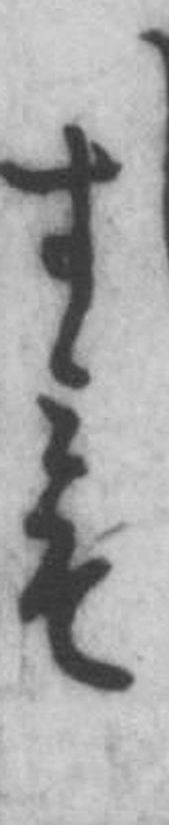すミそ
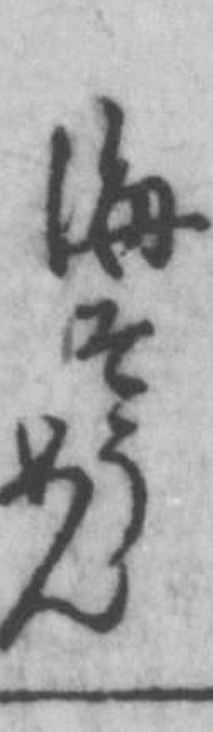海そうミる
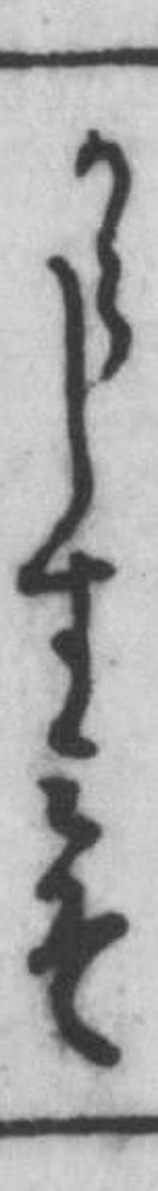からしずミそ
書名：料理献立抄
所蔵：大阪府立大学学術情報センター 国文学研究資料館
